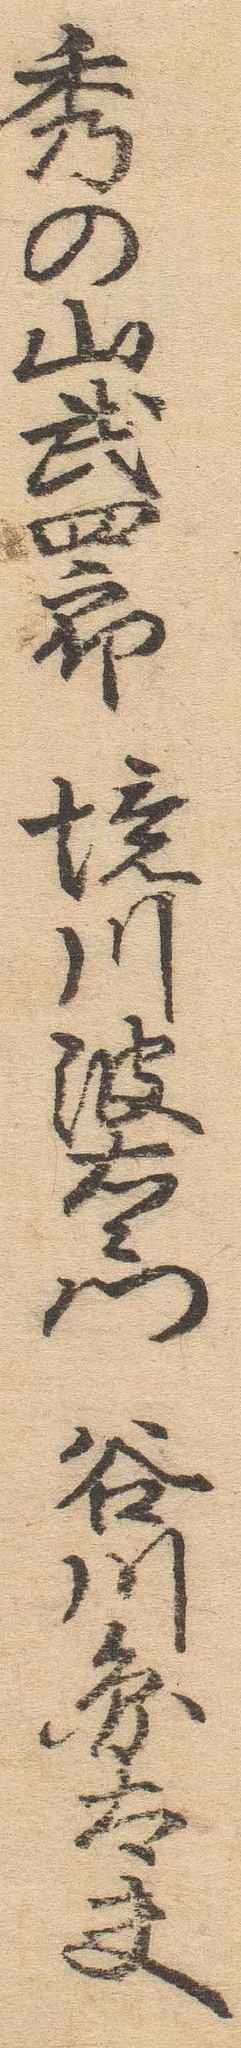秀の山武四郎境川波右衛門谷川圓太夫
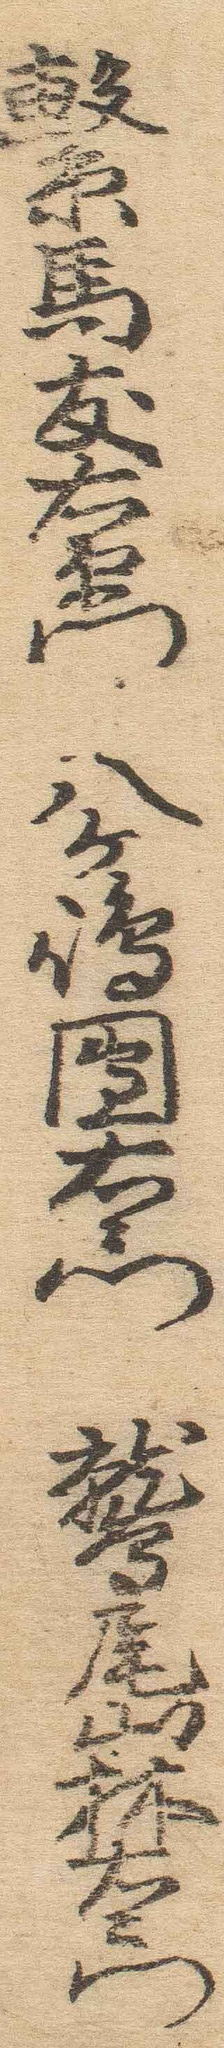繋馬丈右衛門八ケ嶋団右衛門鷲尾山林右衛門
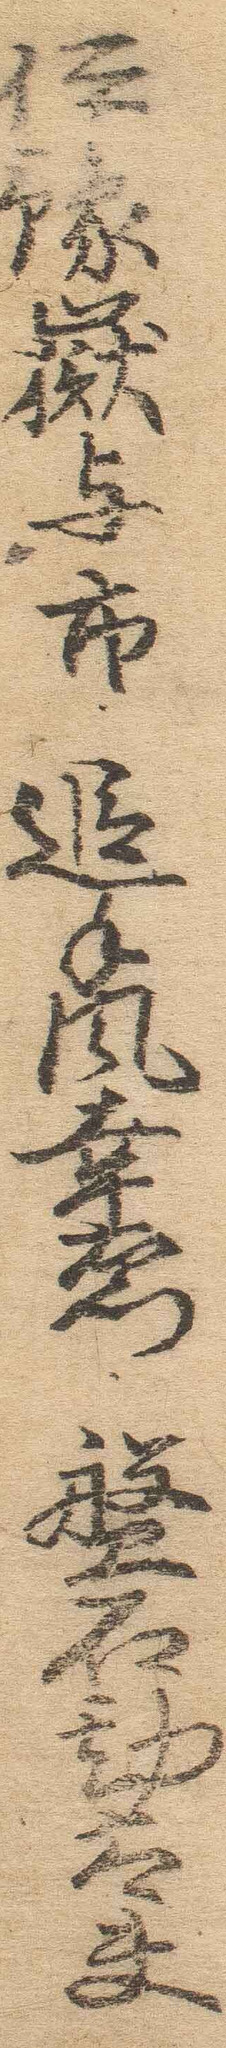伊豫嶽与市追手風幸右衛門盤石勘太夫
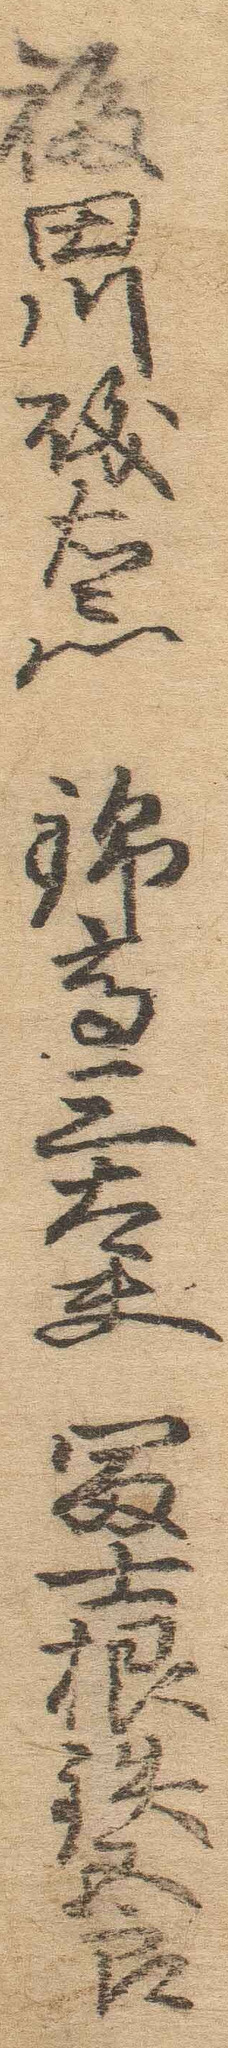福田川磯右衛門錦鳥三太夫冨士根鉄五良
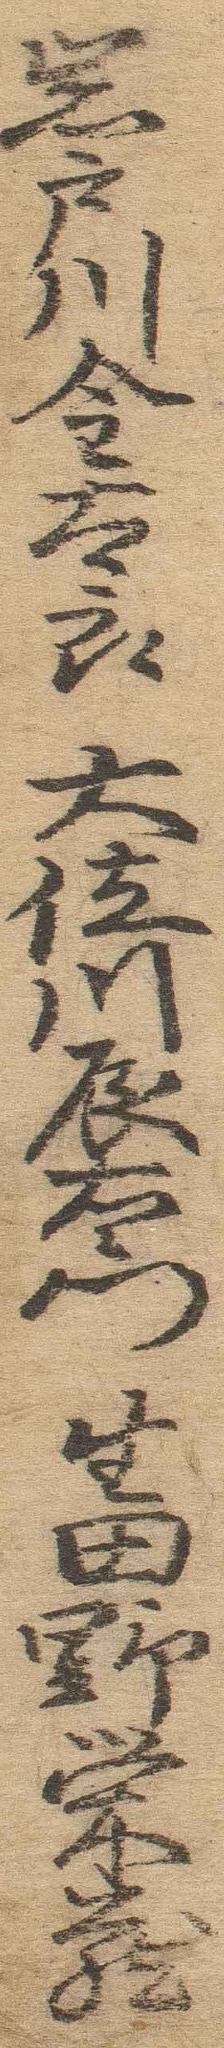岩戸川金太郎大位川辰右衛門生田野栄蔵
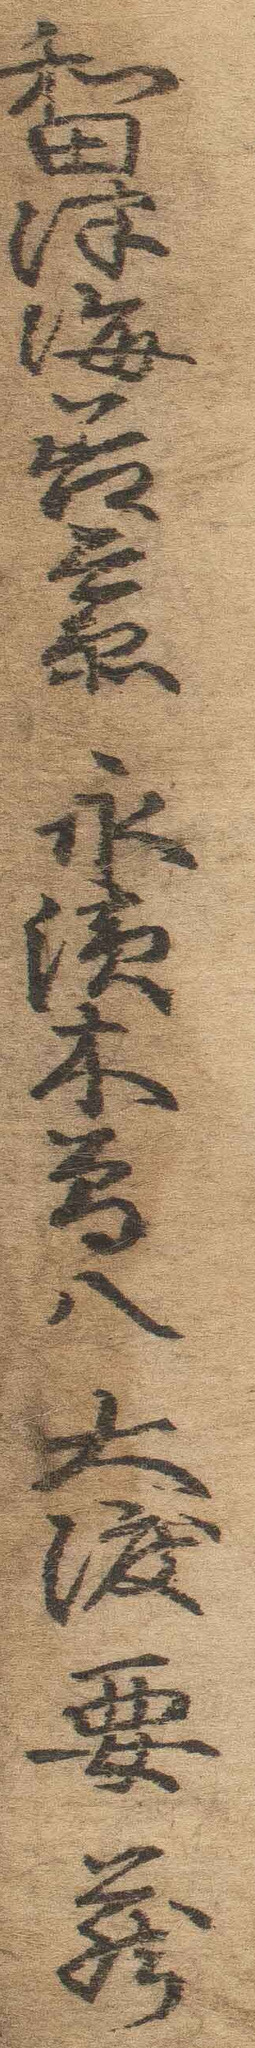和田津海善兵衛永浜木曽八大渡要蔵

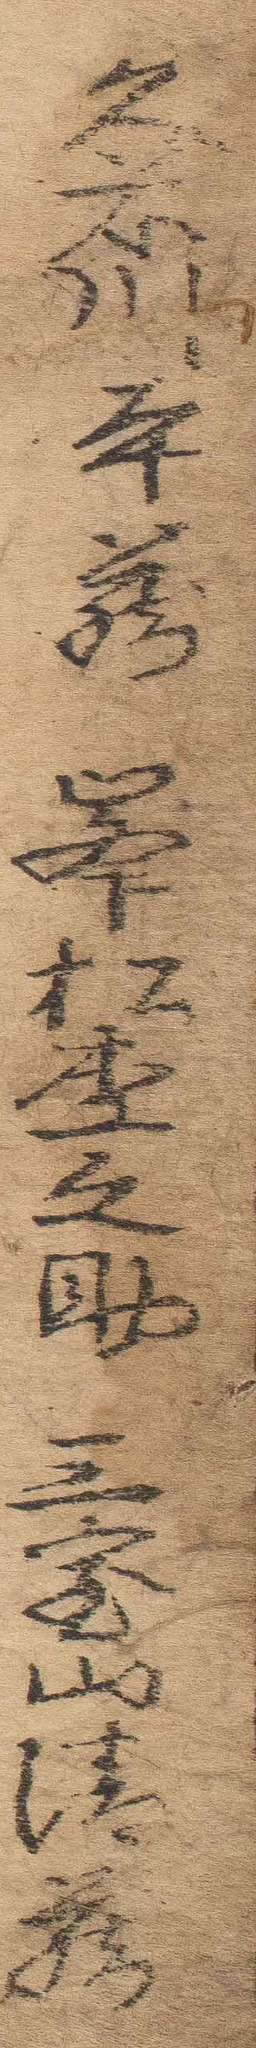名前川平蔵峯松杢之助三宝山清蔵
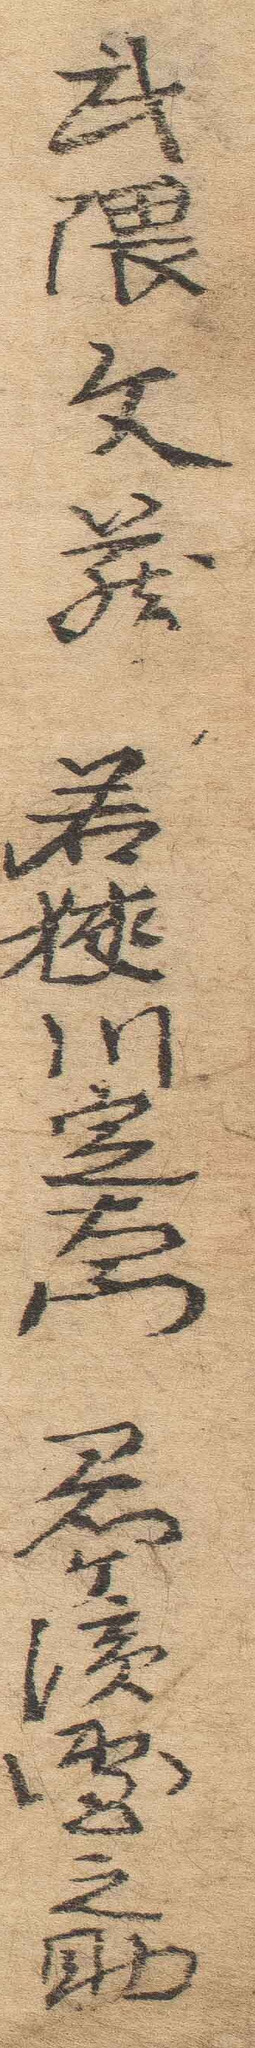竹隈文蔵若狭川定右衛門君ケ濱団之助
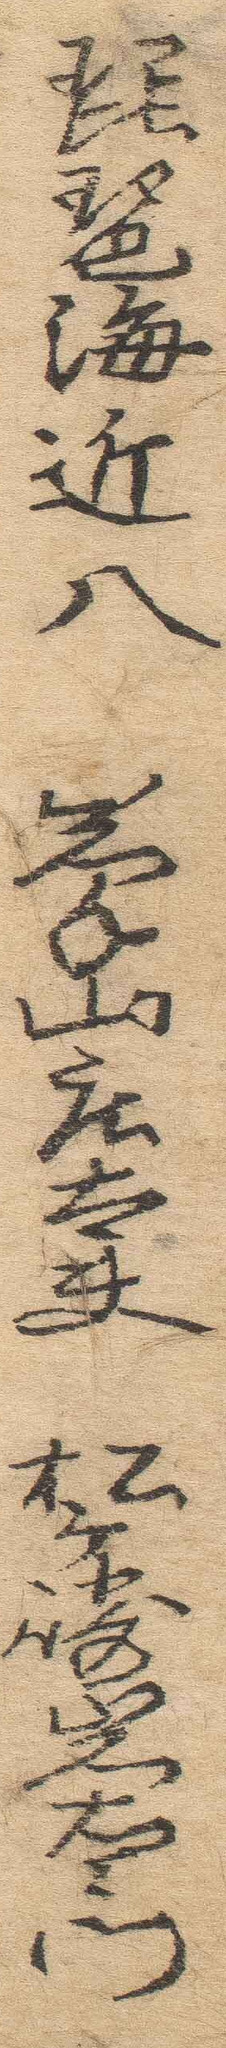枇杷海近八岩手山庄太夫松ケ崎岩右衛門
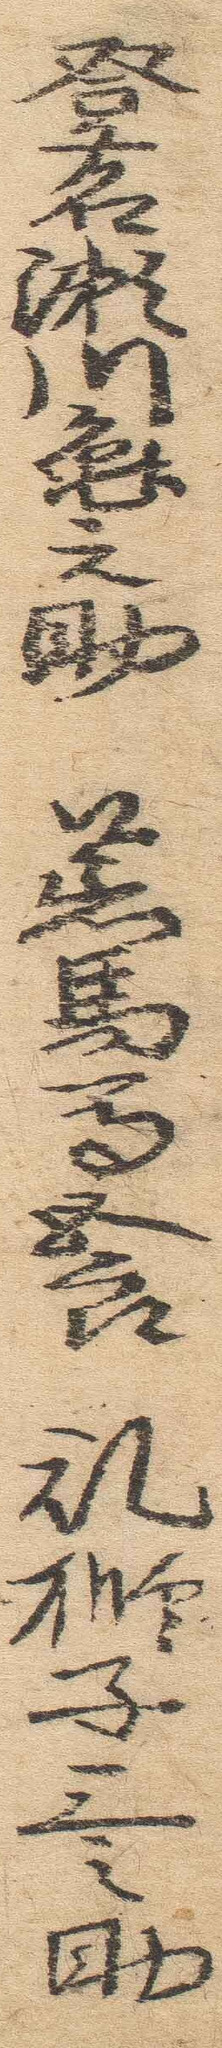登名瀬川亀之助荒馬馬五良礼獅子三之助
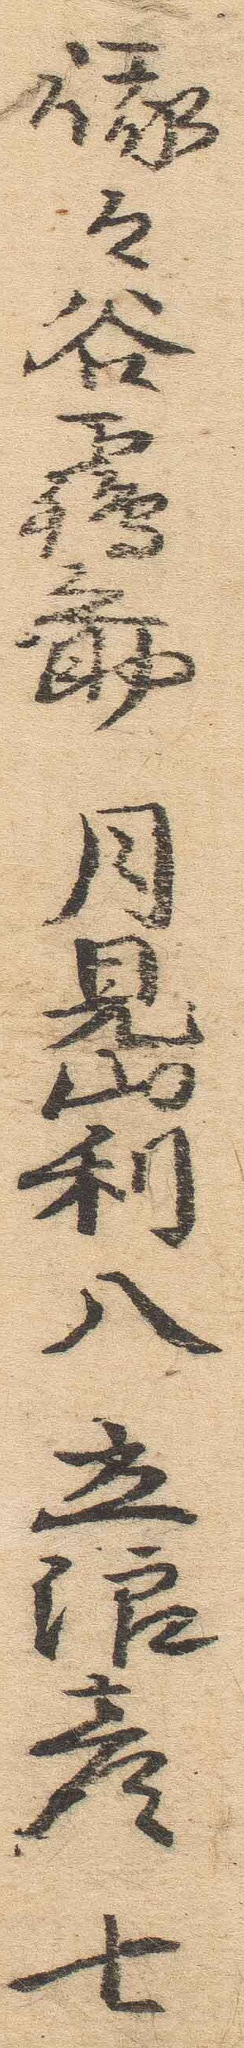峨々谷鶴之助月見山利八立浪彦七
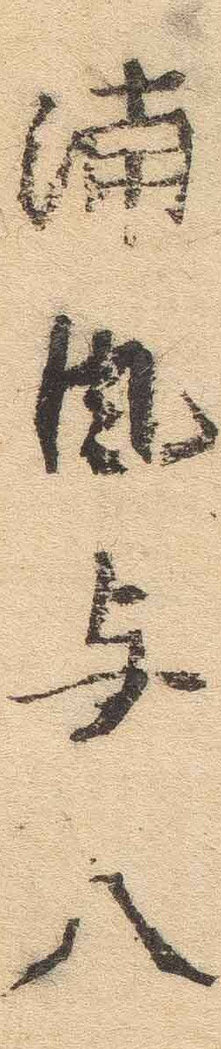浦風与八
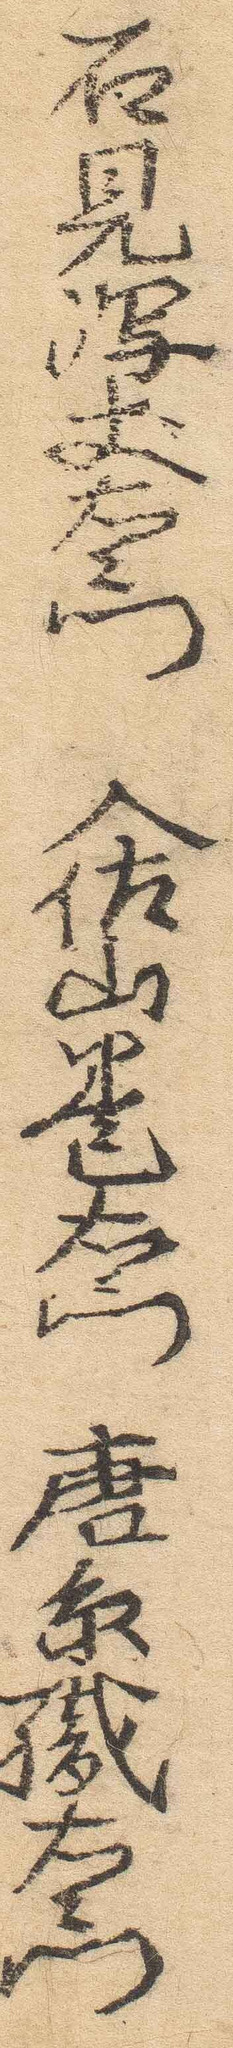南部石見潟丈右衛門入佐山巻右衛門唐糸織右衛門
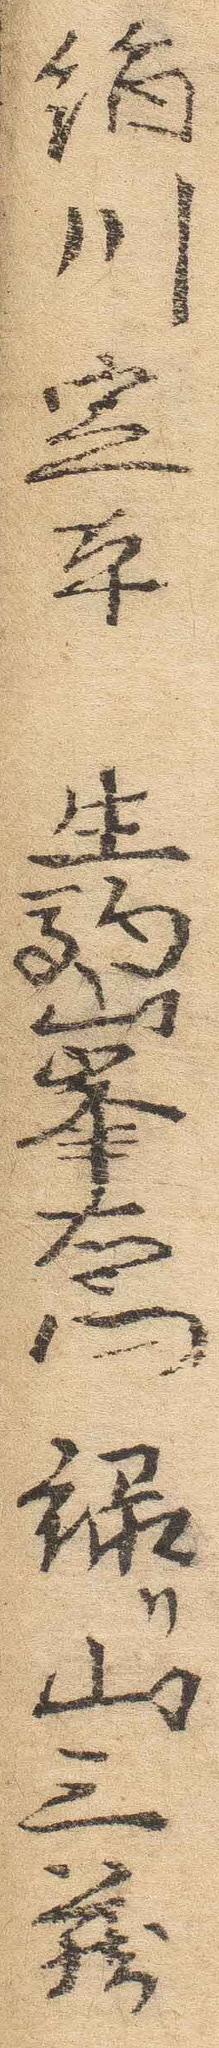箱川定平生駒山峯右衛門緑り山三蔵
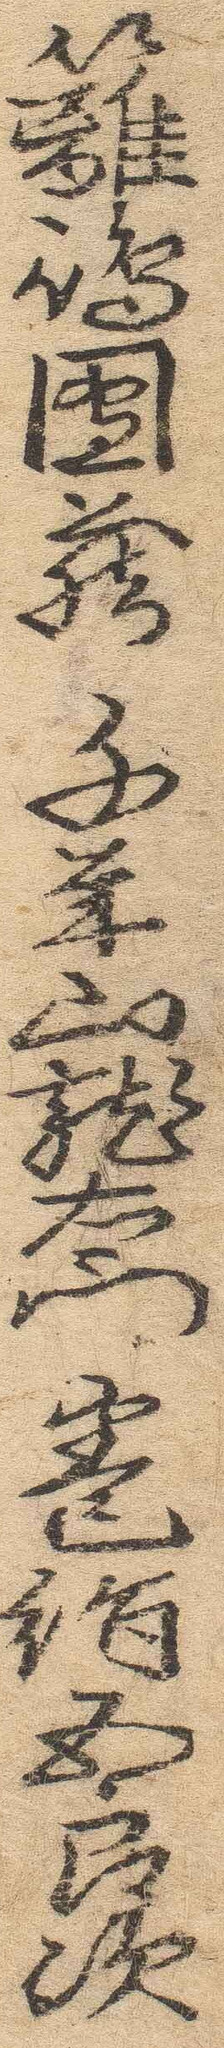籬嶋団蔵千年山龍右衛門巻絹五良次
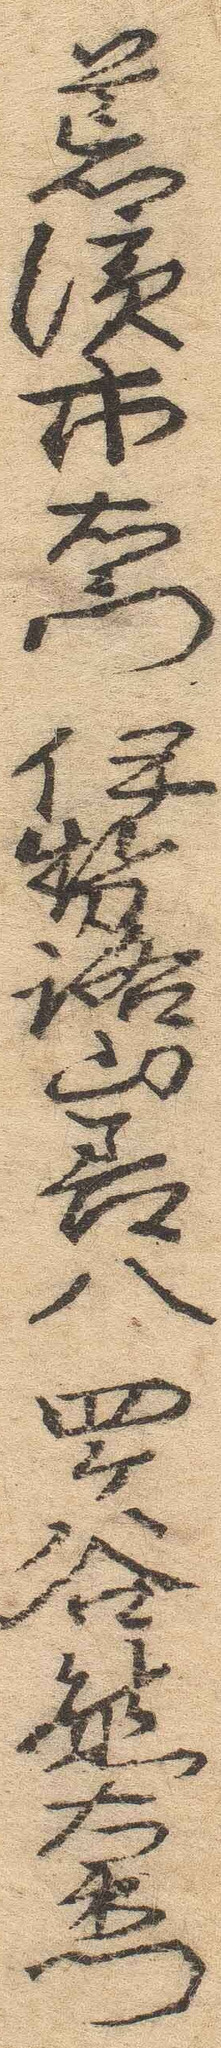荒濱市右衛門伊勢路山善八四ケ谷熊右衛門
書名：古今相撲大全
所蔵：東京学芸大学附属図書館 国文学研究資料館
